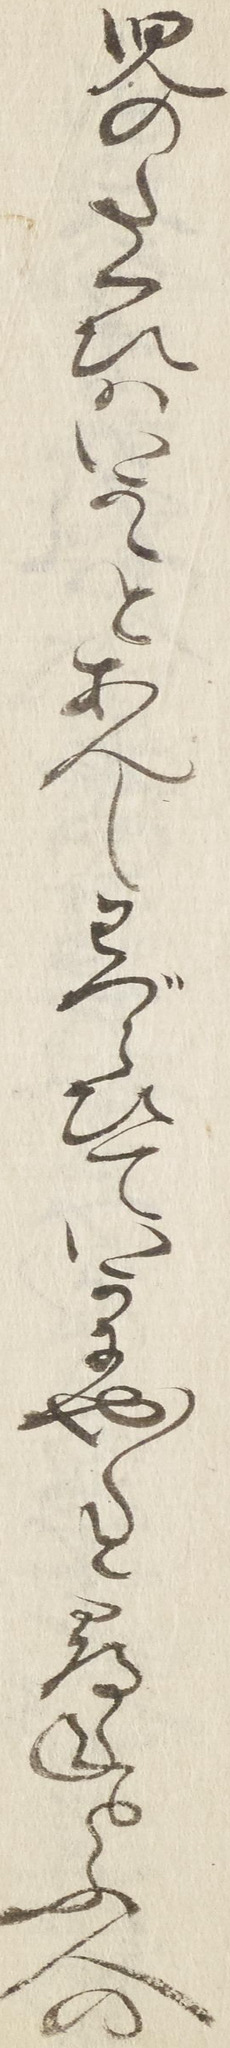児のたくひはいかゝとあんしわづらひていかにや〳〵と尋ねとふ人の
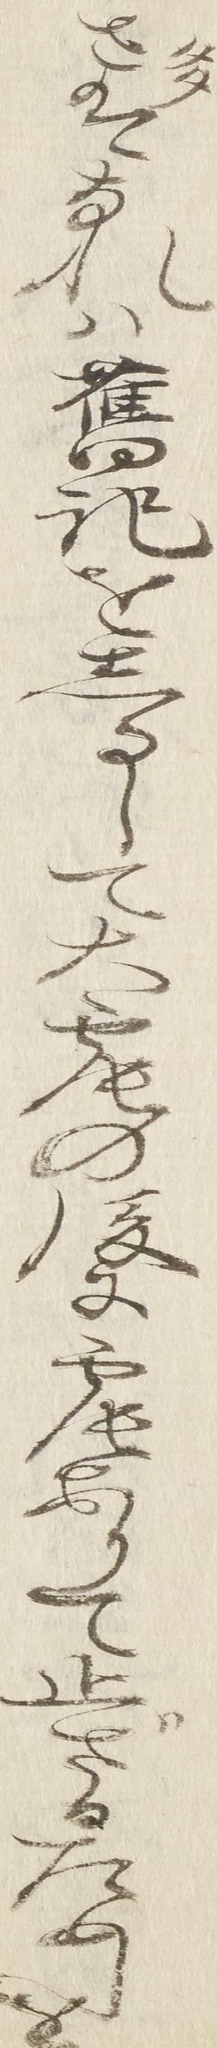さ多はなれは舊記をしるして大震の後に震ありて止ざるためしを
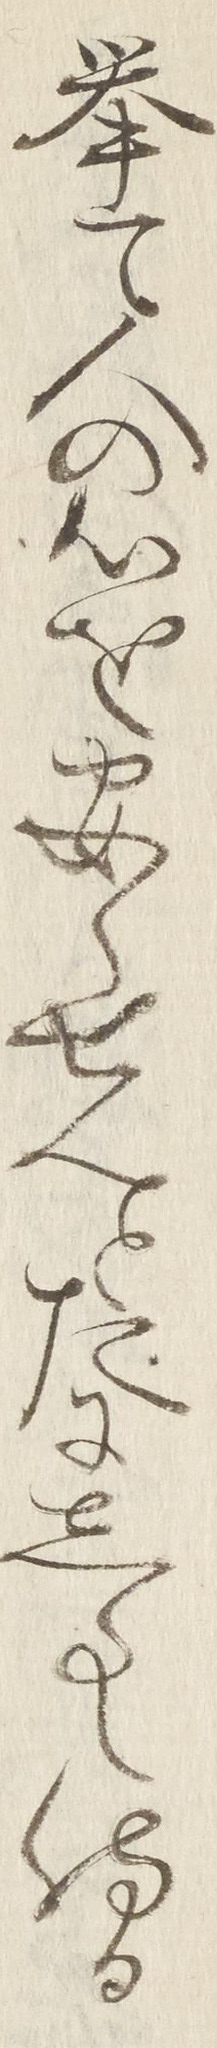挙て人の心を安くせんと左にしるし侍る
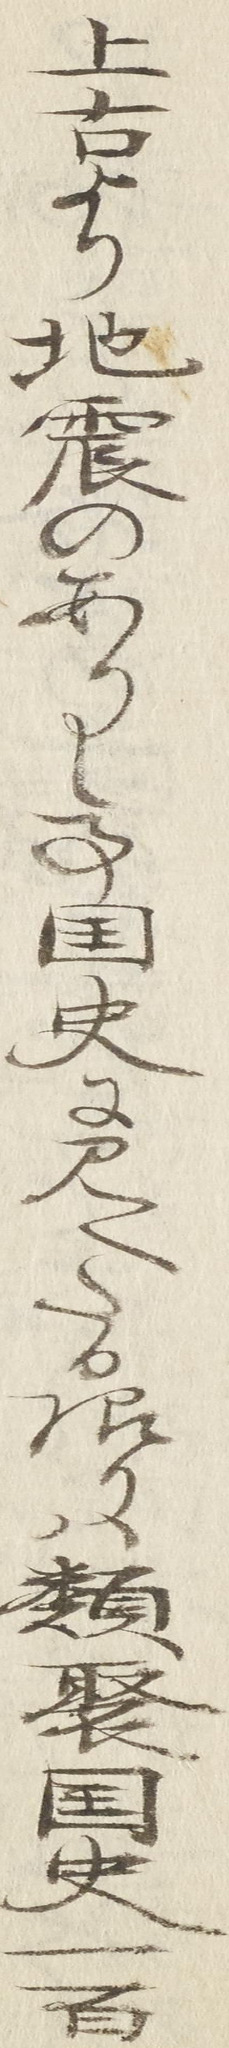上古より地震のありし事国史に見へたる限りは類聚国史一百
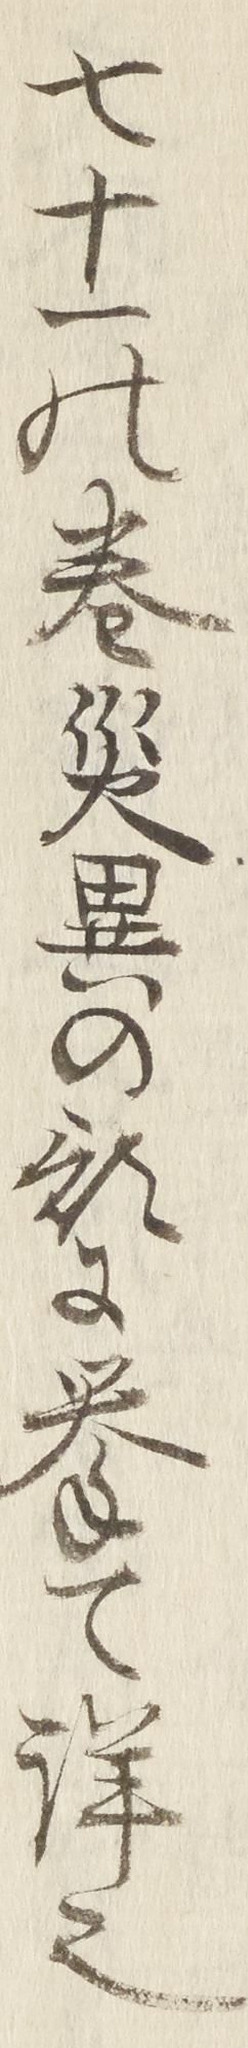七十一の巻災異の部に挙て詳也
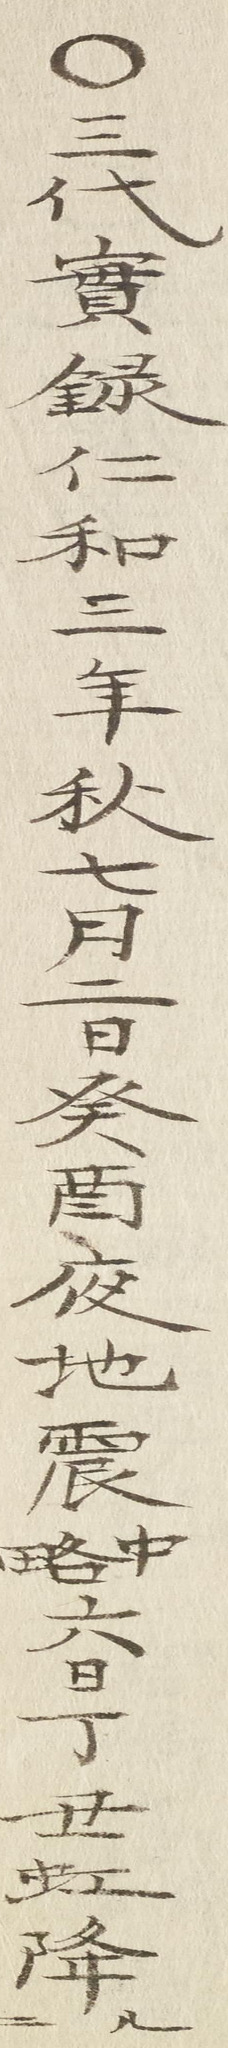〇三代実録仁和三年秋七月二日癸酉夜地震中略六日丁丑虹降る
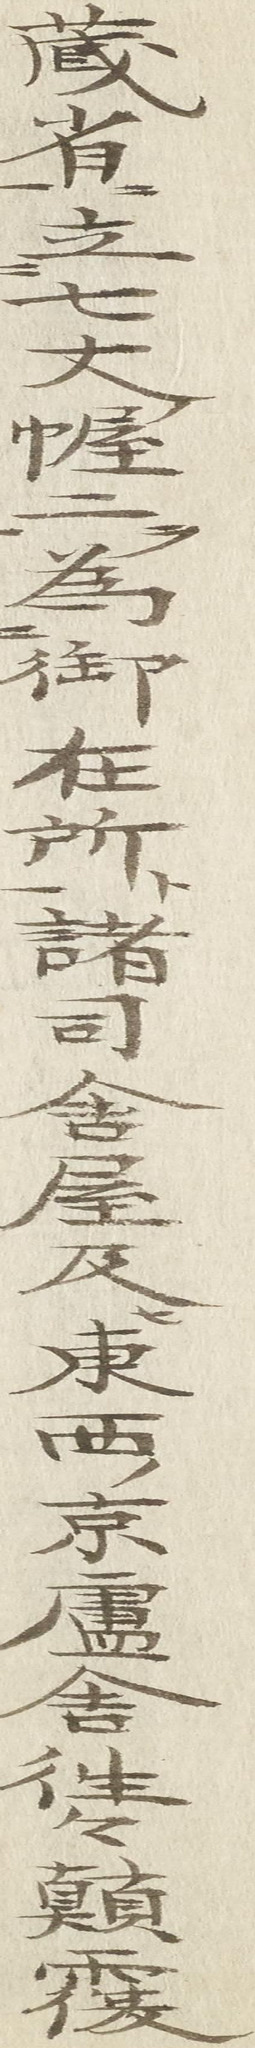蔵省に立七大の幄二を為御在所と諸司舎屋及び東西の京蘆舎往々顛覆
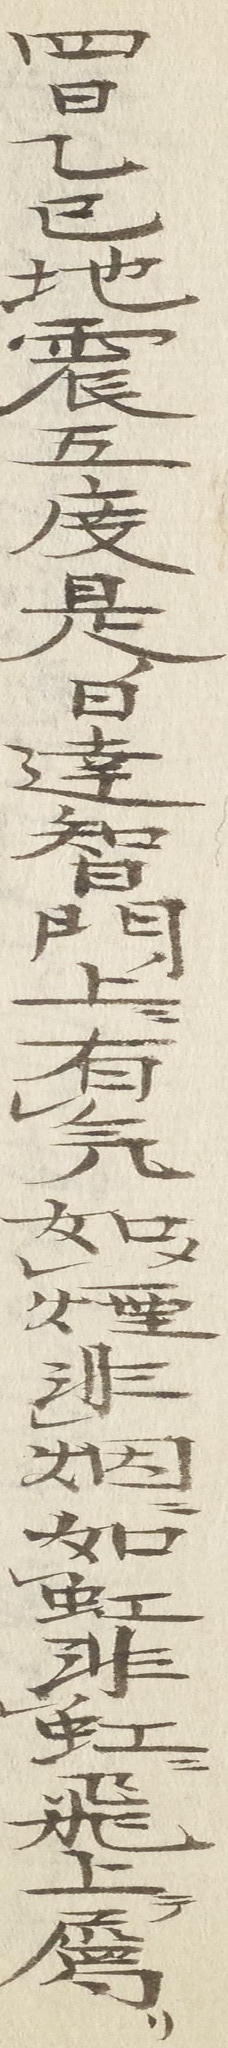四日乙巳地震五度是の日達智門の上に有気如め煙非烟に如虹非虹に飛上て属り
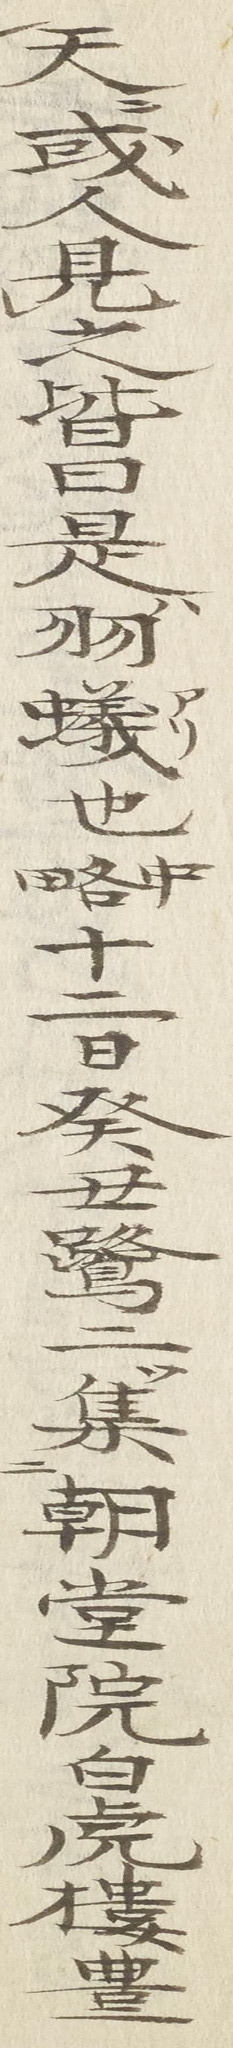天に或人見之皆曰是は羽蟻也中略十二日癸丑鷺二つ集朝堂院白虎豊樓
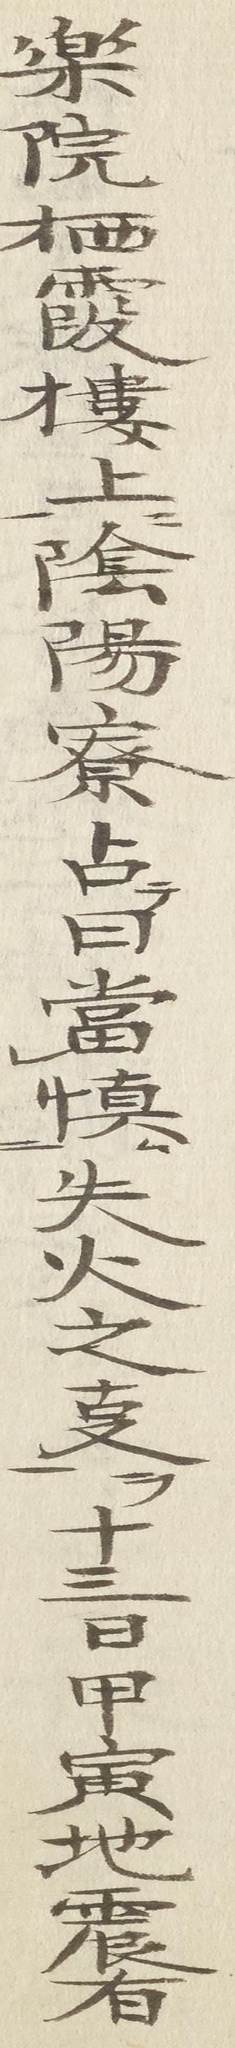楽院栖霞樓上に陰陽寮占て曰当慎は失火之事を十三日甲寅地震有
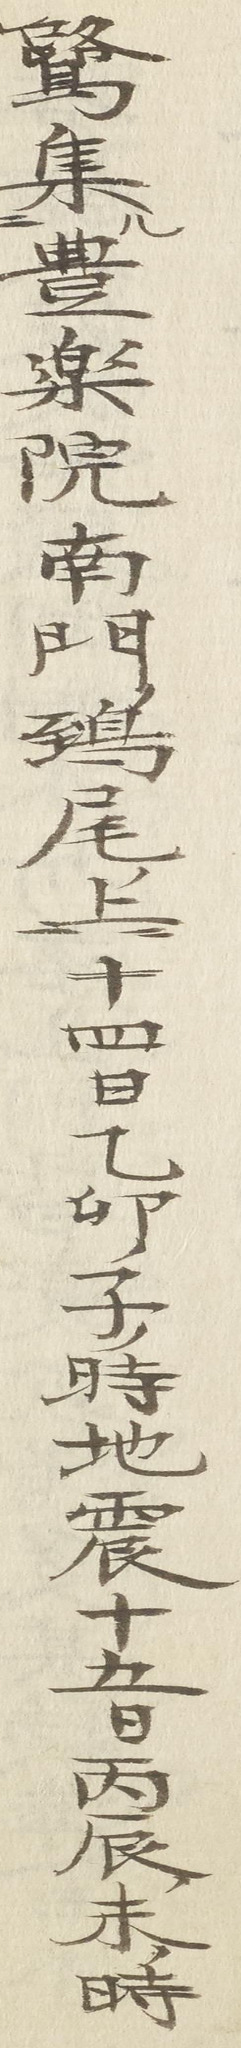鷺集る豊楽院南門の鵄尾の上に十四日乙卯子の時地震十五日丙辰未の時

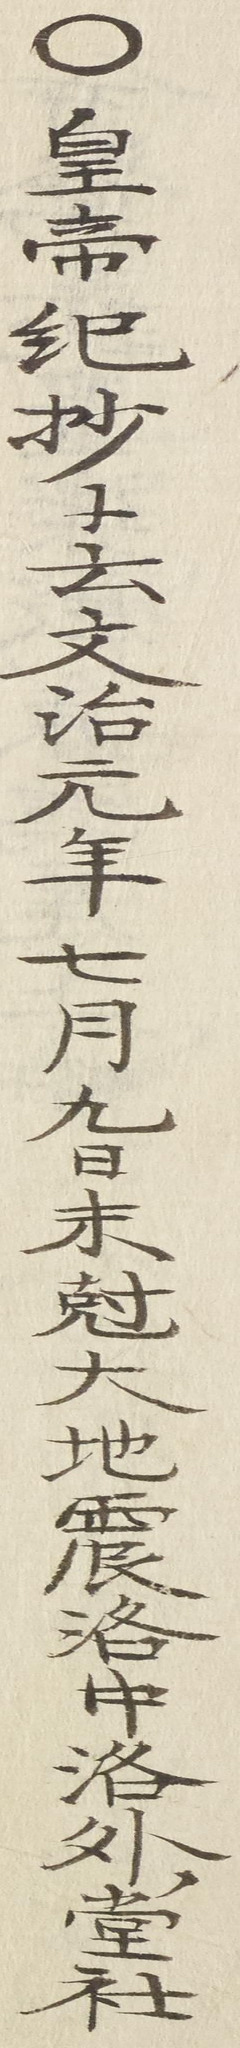〇皇帝紀抄に云文治元年七月九日未尅大地震洛中洛外の堂社
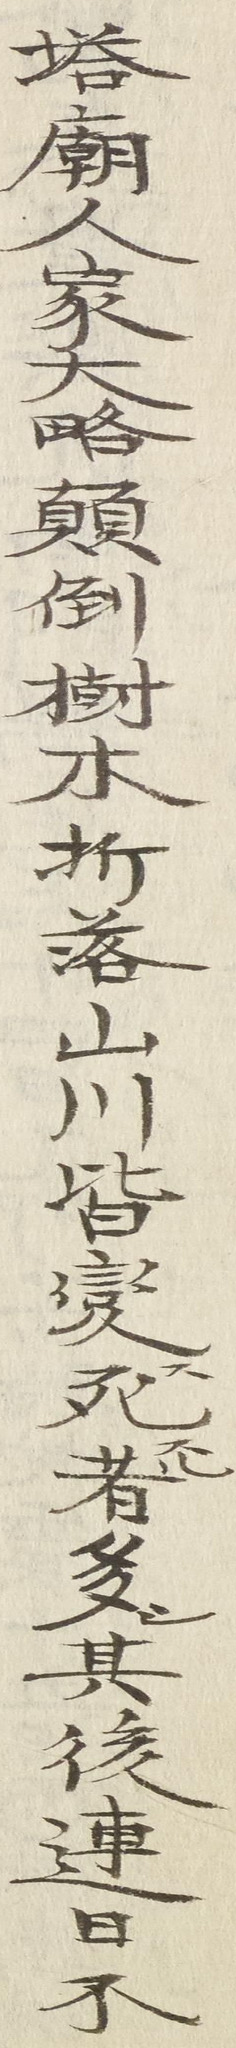塔廟人家大略顛倒樹木折落山川皆変す死する者多し其後連日不
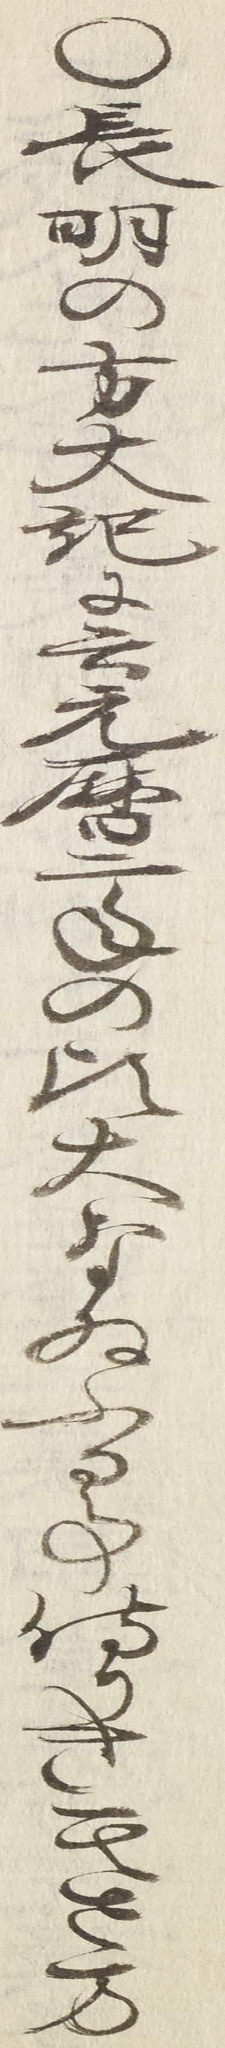〇長明の方丈記に云元暦二年の頃大なゐふる事ありき其さま
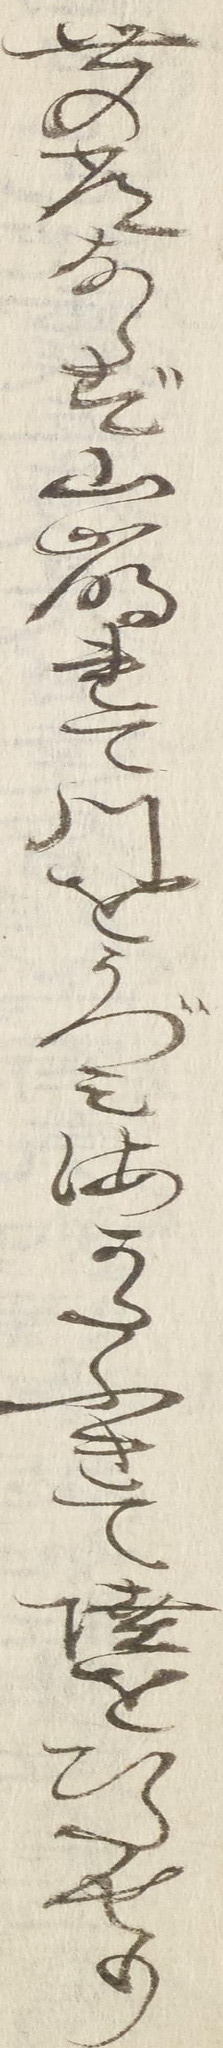世の常ならず山崩れて川をうづみ海かたふきて陸をひたせり
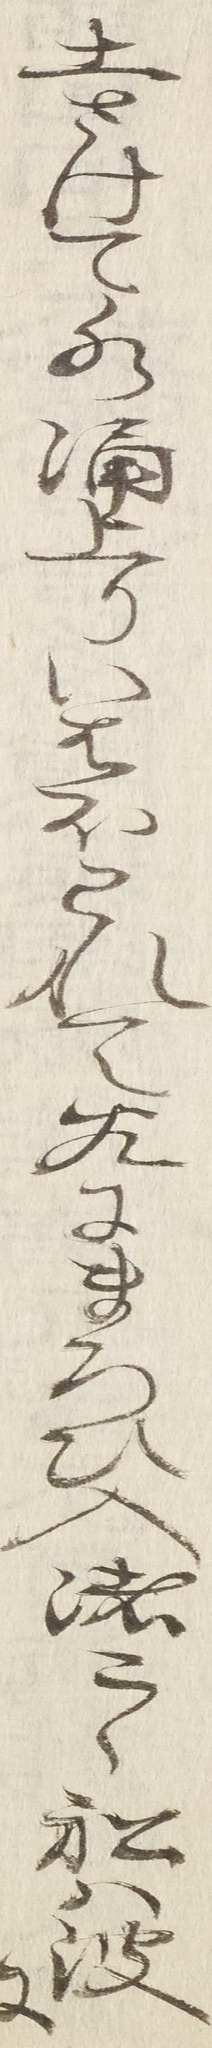土さけて水漏上りいはほわれて谷にまろひ入渚こく船は波に
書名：地震記　下
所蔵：東京大学地震研究所図書室 Earthquake Research Institute Library, The University of Tokyo, JAPAN
